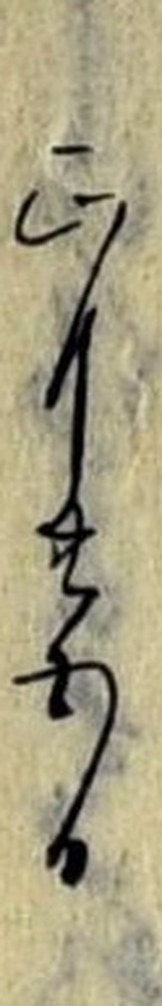正月廿五日
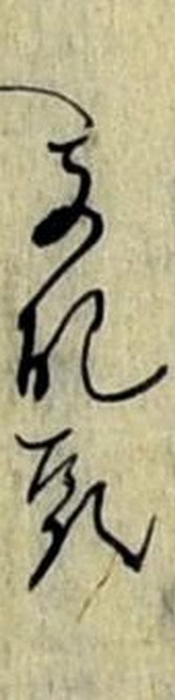支配頭
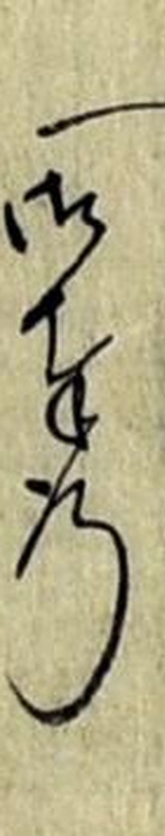御奉行
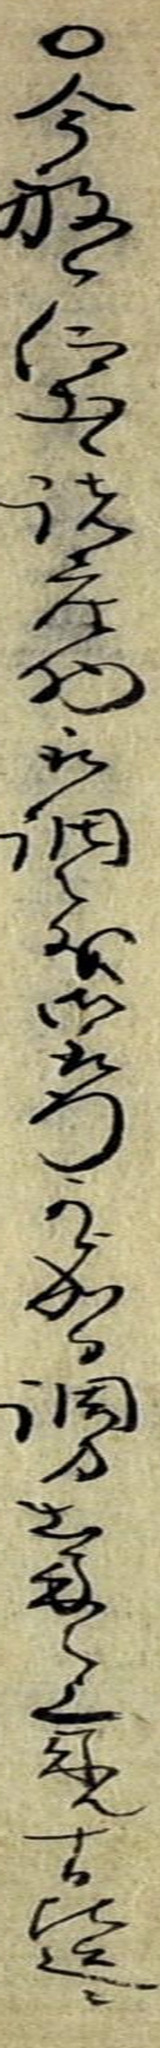○今般被仰出候諸産物取調之義御取行可被成与調方出来之上来ル十日頃迄に
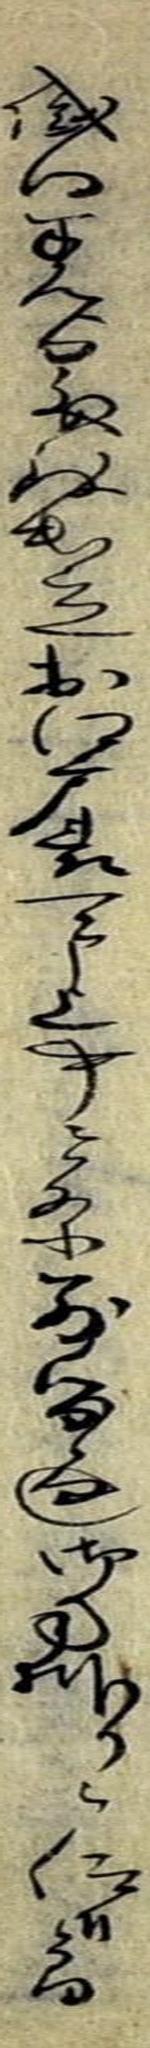織田半左衛門義致出立於江戸表可申上事ニ候条別紙之通御用掛り被仰付候間
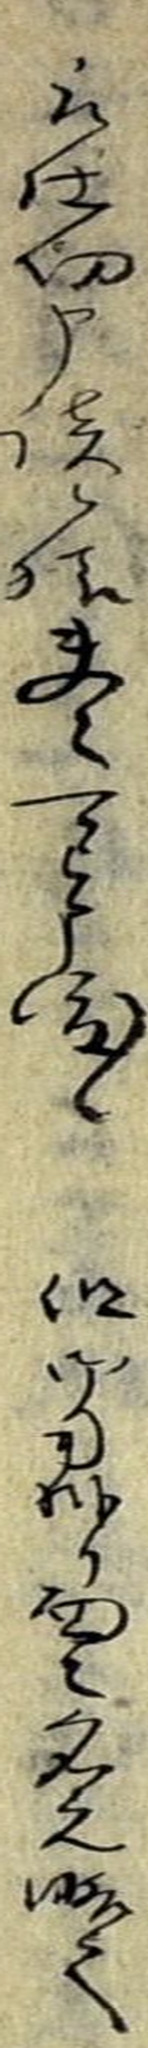被仕切申談候様夫々可被申渡候但御用掛り面々名元略之
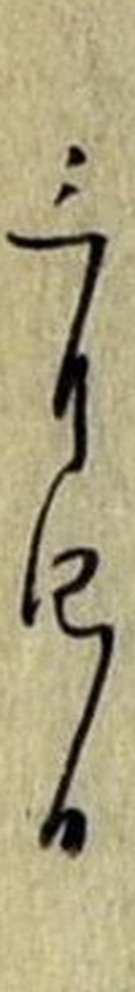三月四日
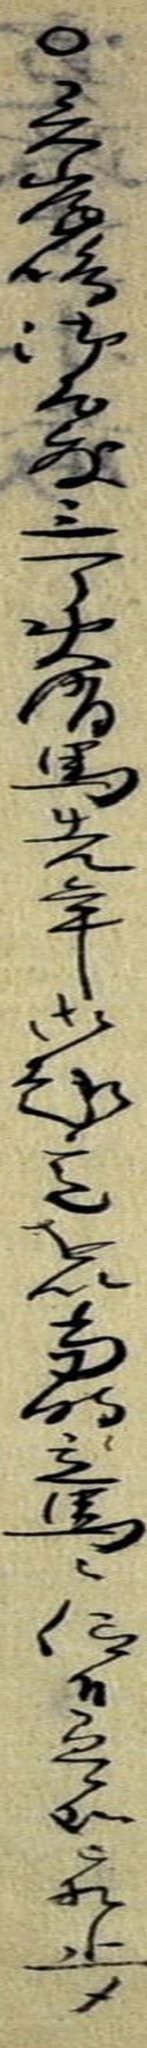○霊岸嶋御屋敷三丁火消馬先年御趣意を以当時立馬被仰付置候処被相止メ
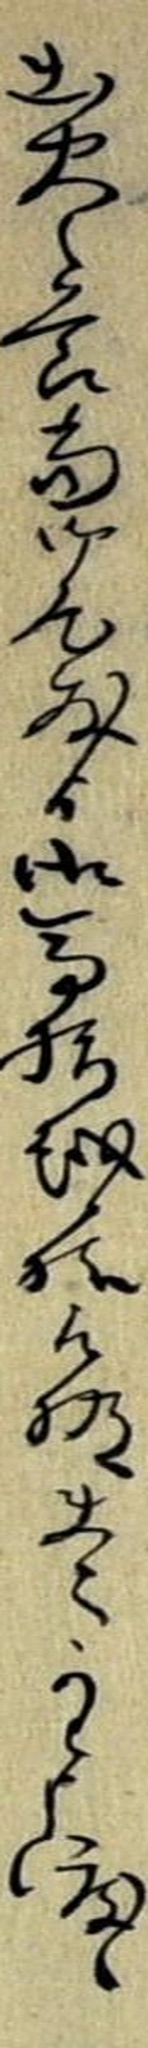出火之節当御屋敷ゟ御馬指越候様取扱夫々可被申渡候
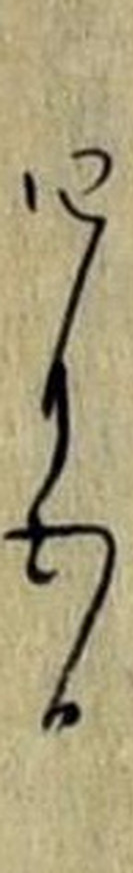四月五日
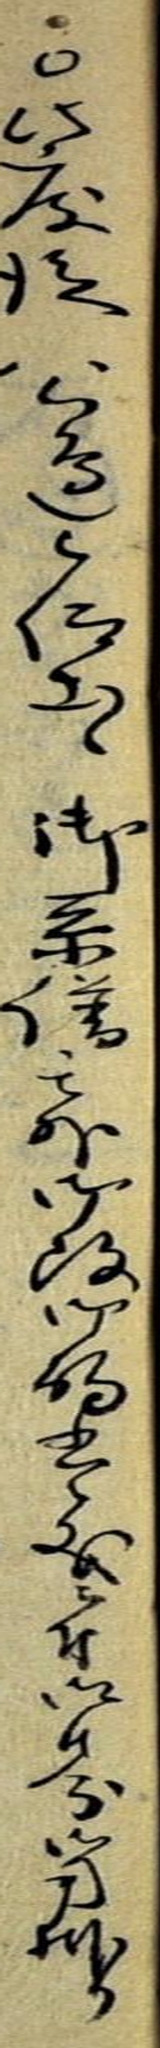○此度従公辺被仰出候御系譜其外御改御触書之義ニ付御自分御用掛り
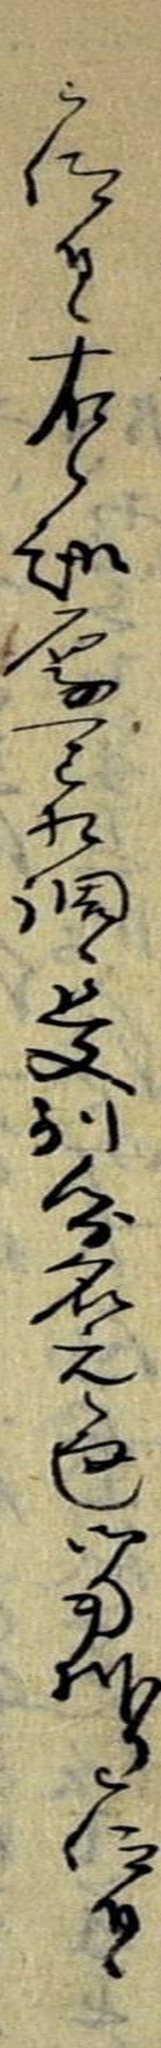被仰付候右之趣厚可被相調候且又別紙名元之通御用掛り被仰付候
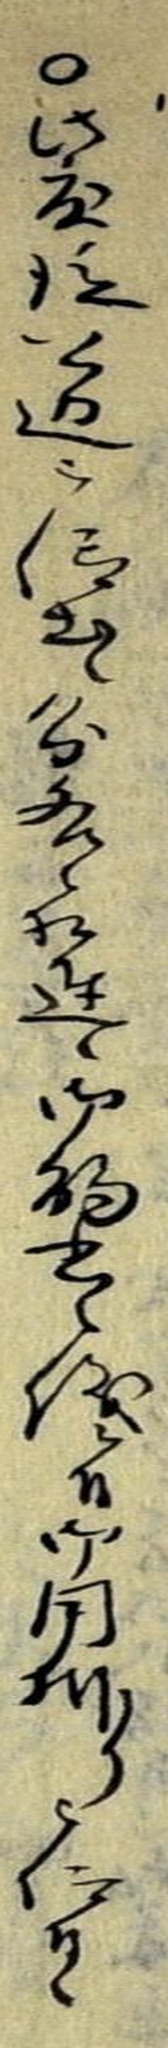○此度従公辺被仰出候分各へ被相達候御触書之儀ニ付御用掛り被仰付候
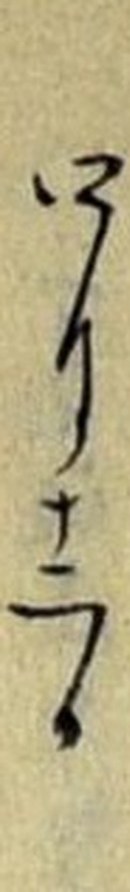四月十二日
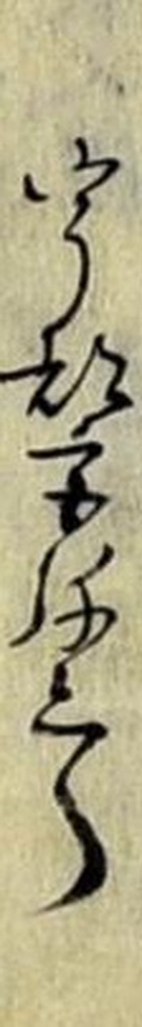宇都宮弥三郎
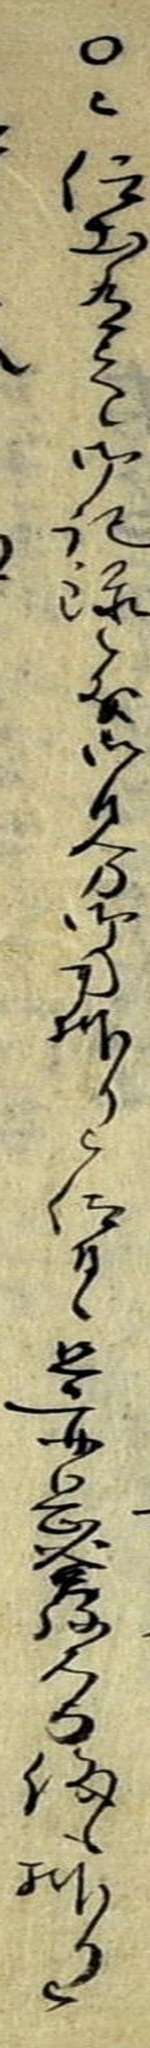○被仰出有之候御記録之義御自分御用掛り被仰付候且亦岡谷弥右衛門儀も掛り被
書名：命令之部 三
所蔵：福井県文書館 Fukui Prefectural Archives
